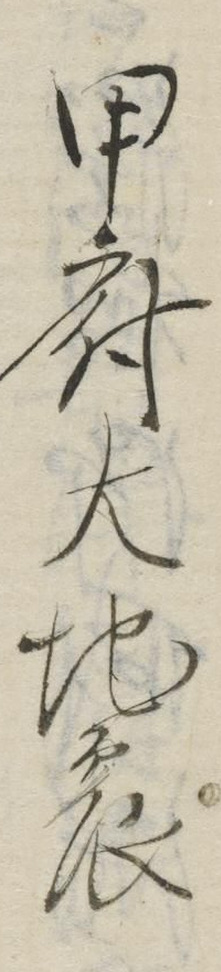甲府大地震
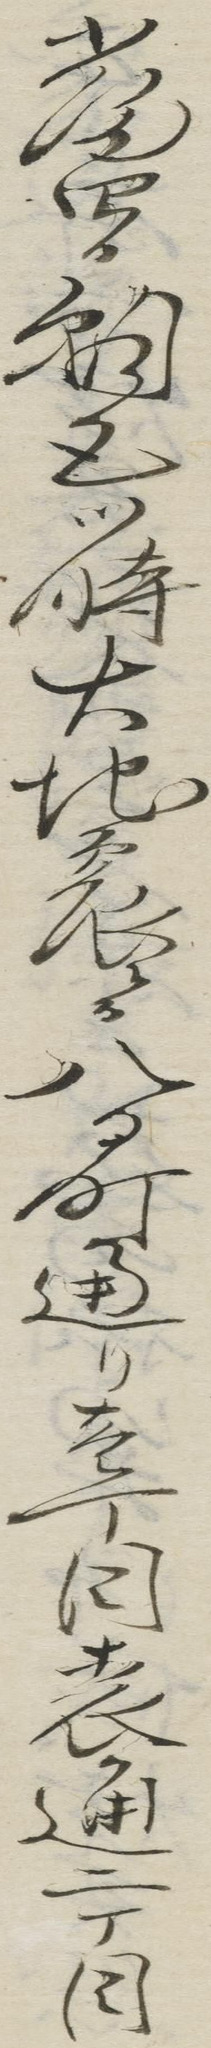当四日朝五ツ時大地震ニ而八日町通り壱丁目表通二丁目
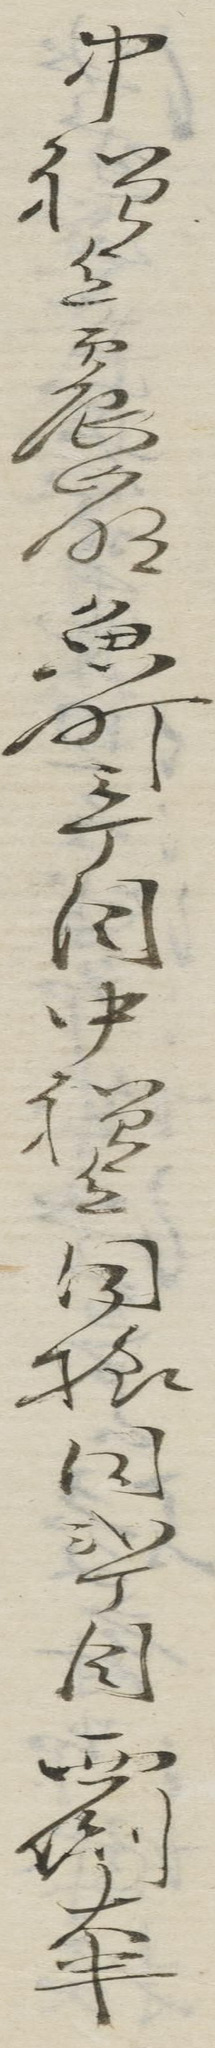中程迄震崩魚町三丁目中程迄同様同弐丁目西側大半
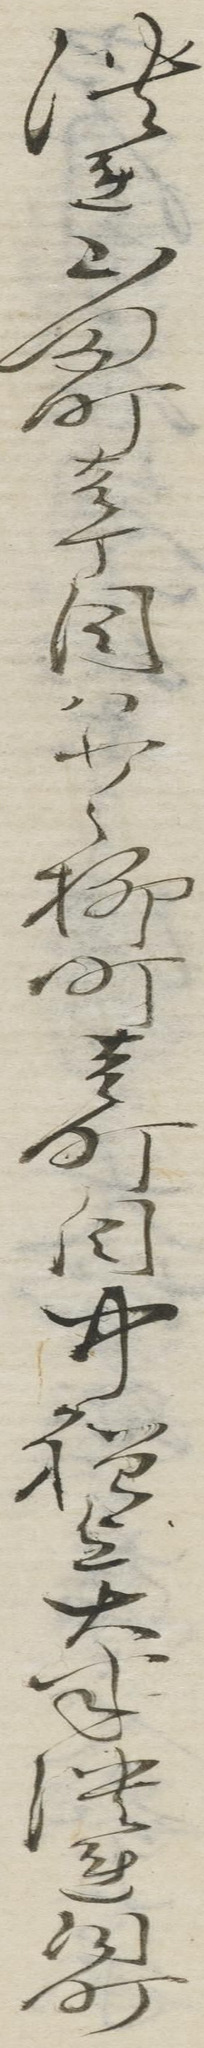潰れ山田町壱丁目ハ少〻柳町壱町目中程まで大半潰れ同町
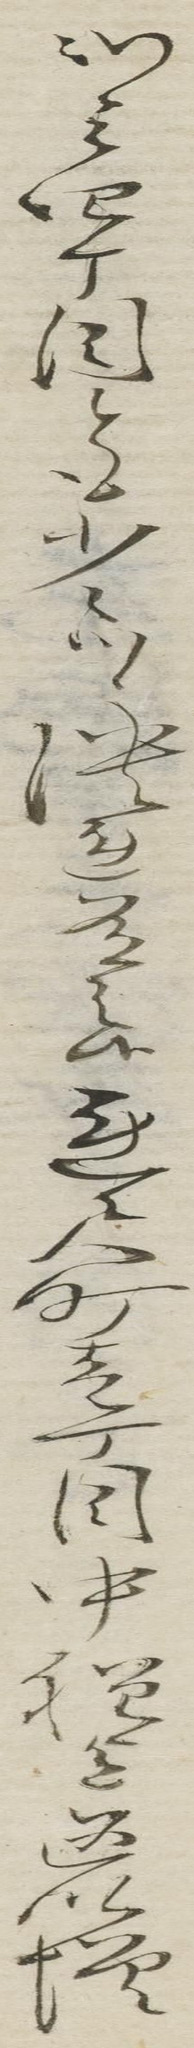弐三四丁目とも少〻ツヽ潰れ有之候連尺町壱丁目中程迄荒増
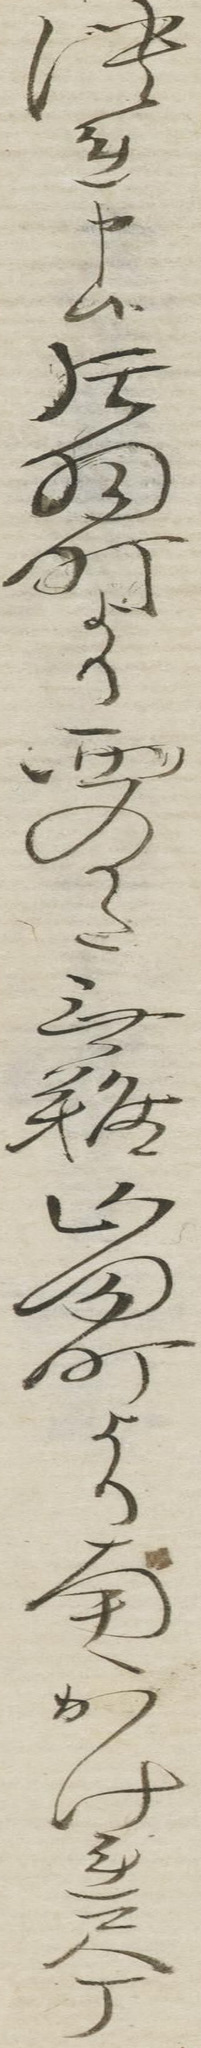潰れ申候片羽町より西のかた無難山田町より南へかけ連尺丁
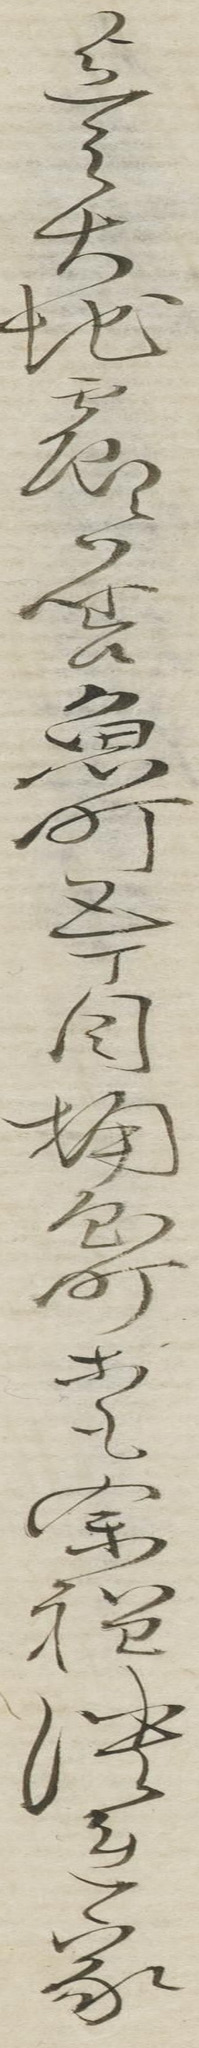迄之大地震ニ御座候魚町五丁目桶屋町等も余程潰れ家
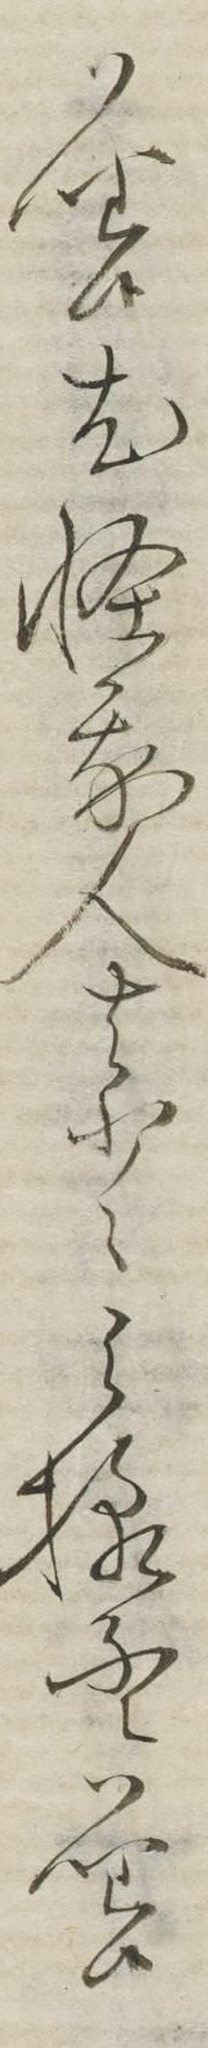御座候怪我人は少〻之様子ニ御座候
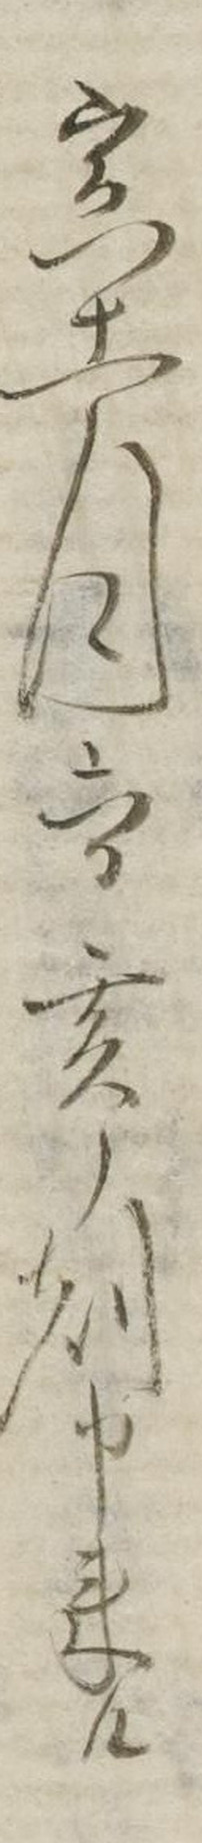寅十一月六日亥ノ刻申来ル

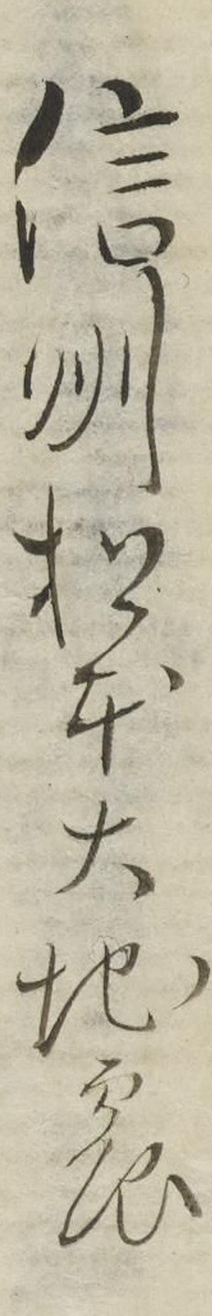信州松本大地震
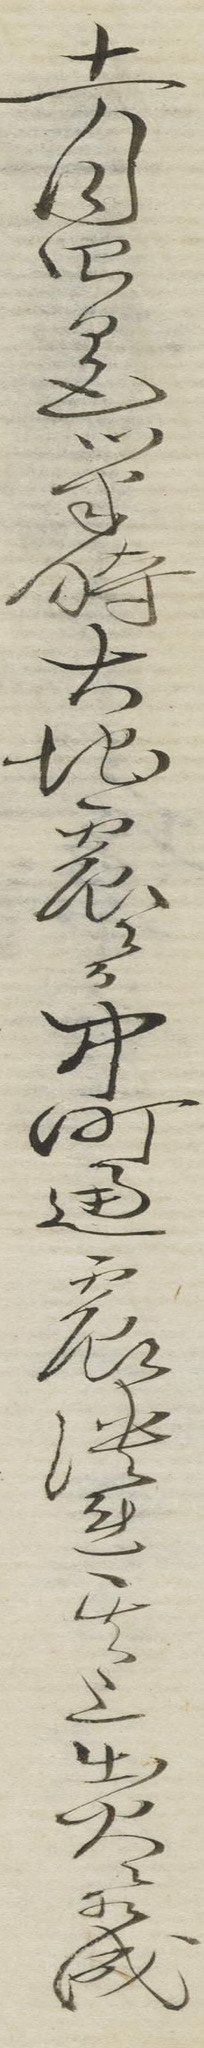十一月四日五ツ半時大地震ニ而中町通震潰れ其上出火ニ相成
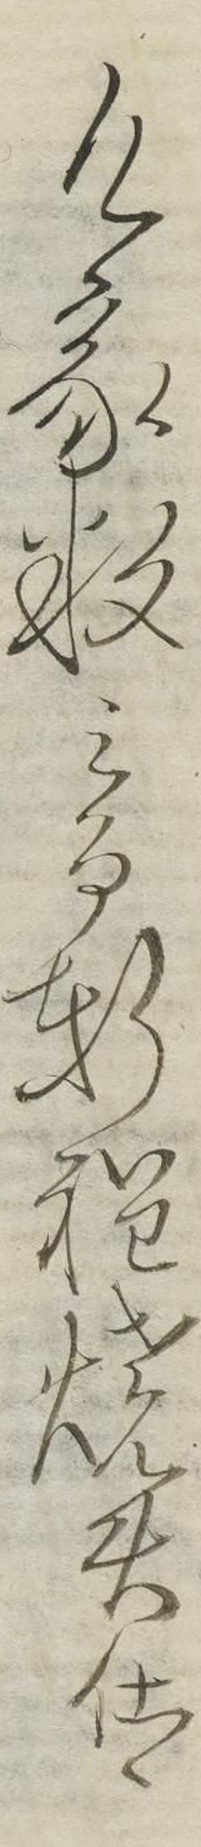凡家数三百軒程焼失仕候
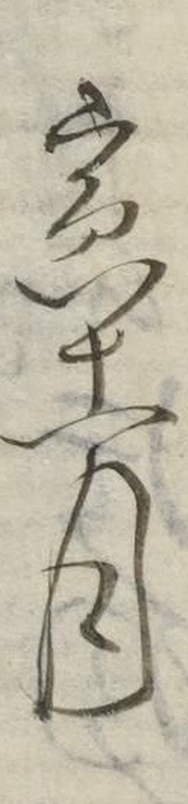寅十一月
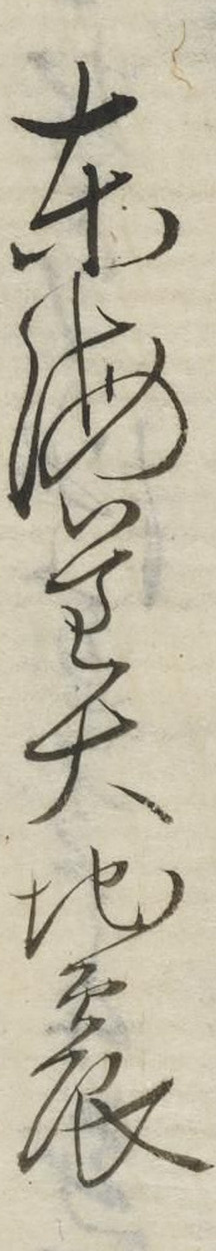東海道大地震
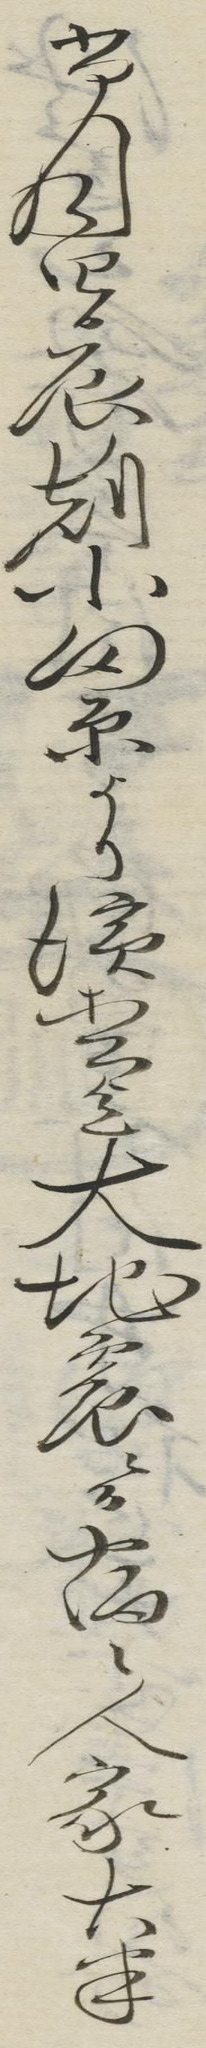当月四日辰ノ刻小田原より濱松迄大地震ニ而宿〻人家大半
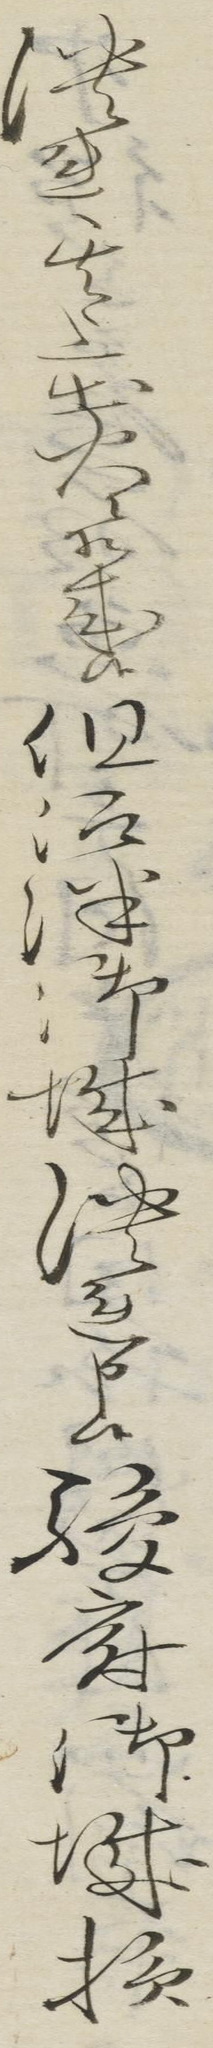潰れ其上出火ニ相成候但沼津御城潰れ申候駿府御城損
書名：大地震實録
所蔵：東京大学地震研究所図書室 Earthquake Research Institute Library, The University of Tokyo, JAPAN
